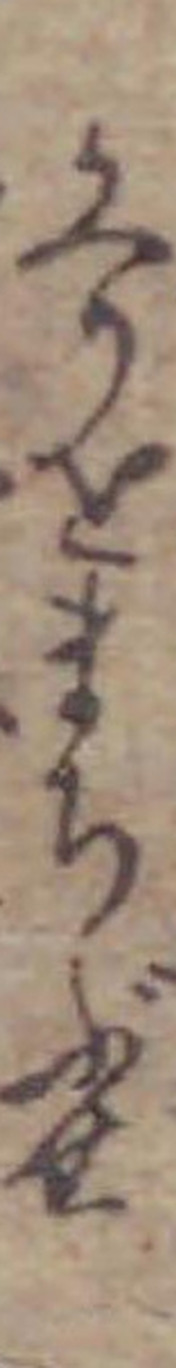かへりをまちぶせ
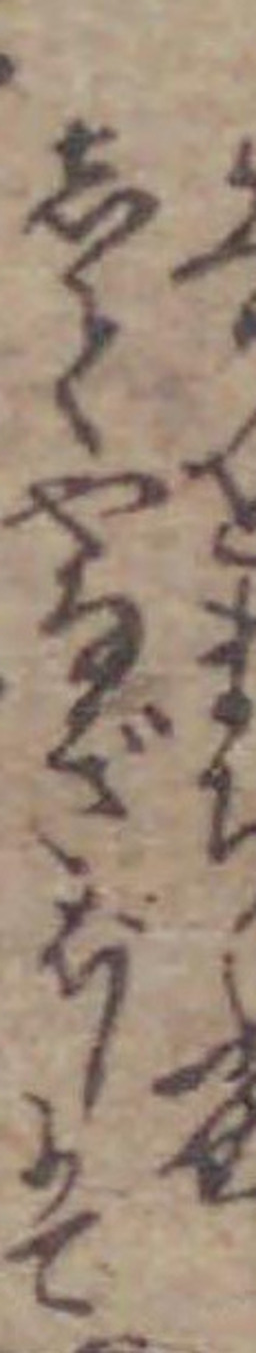してやなぎばしにて
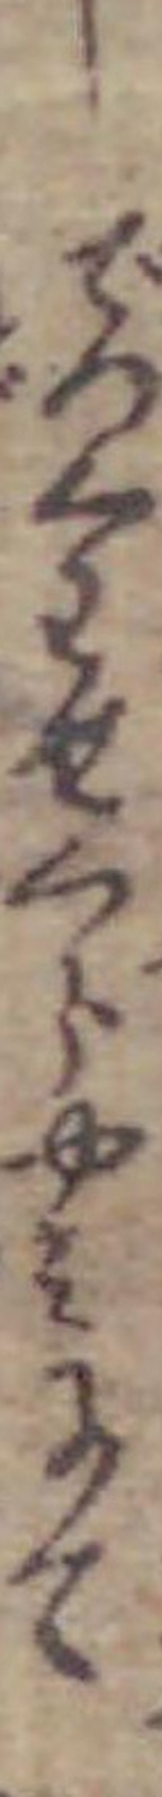でつくわせくらやみにて
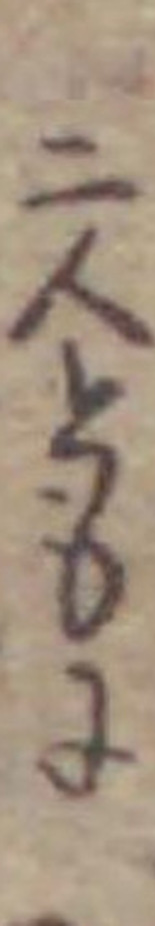二人ともに
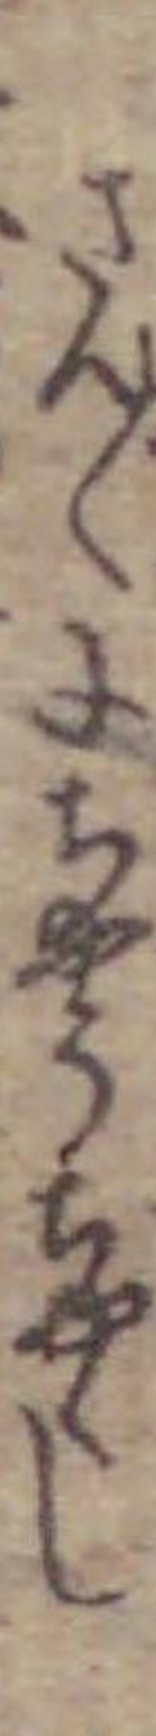さん〴〵にちやうちやくし
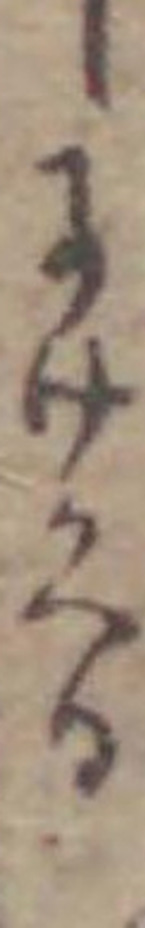にけかへる

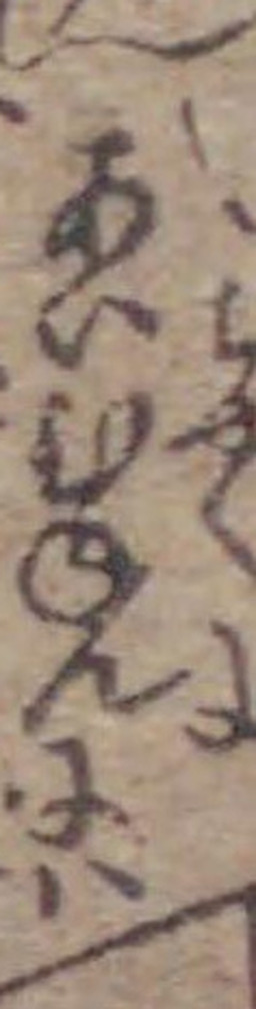あいむねんには
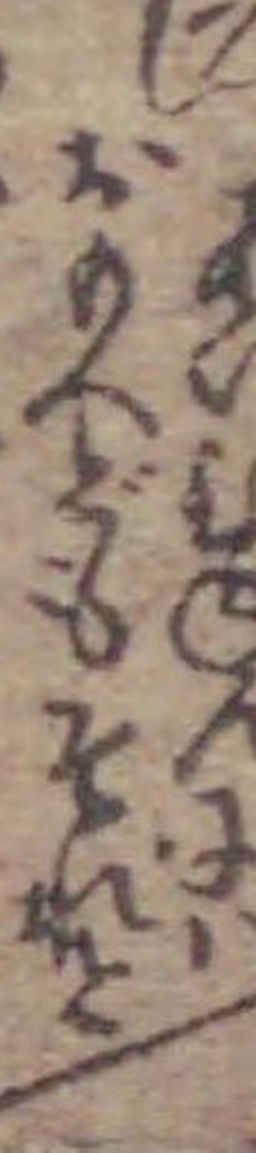おもへどもそれと
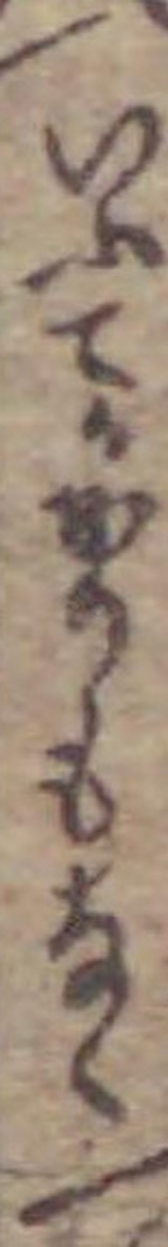いふてかわりもなく
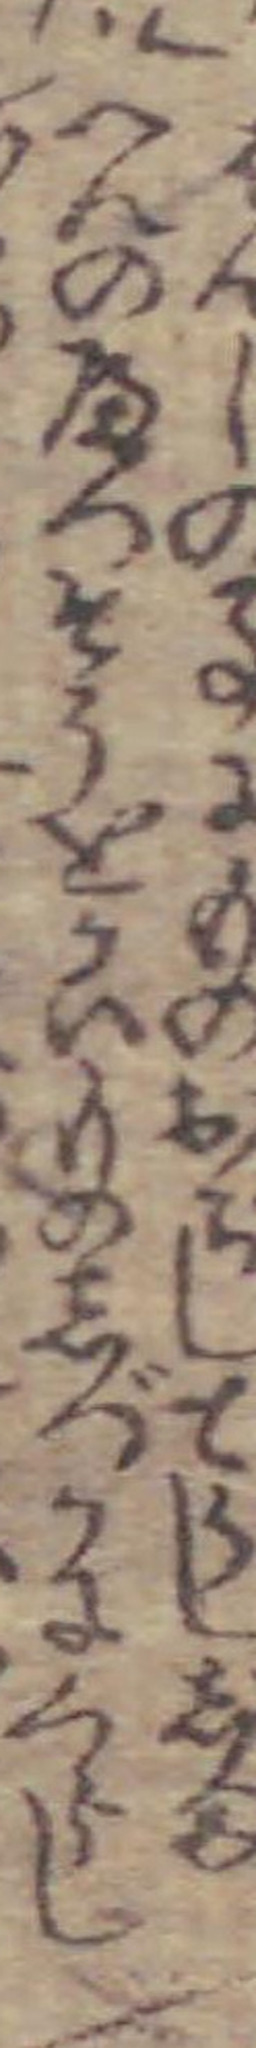へんのへつそうをかいものしづかにくらし
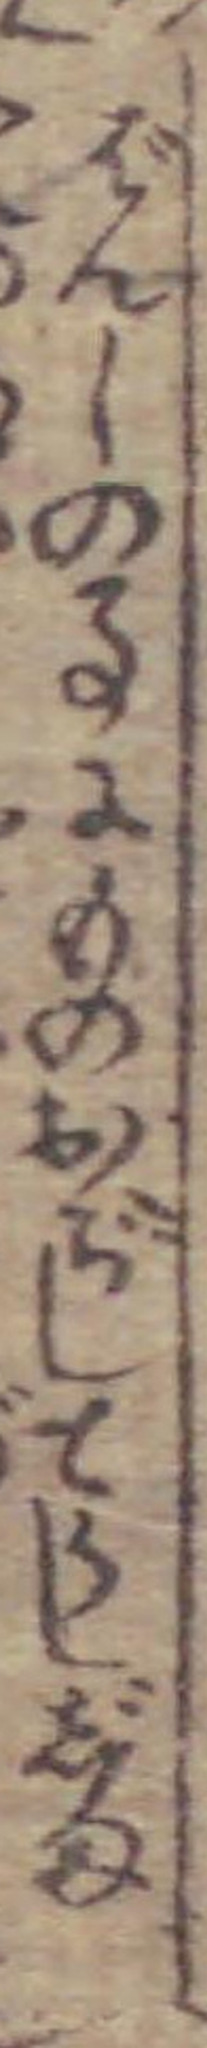ばんしの事にものおぢしてうしじま
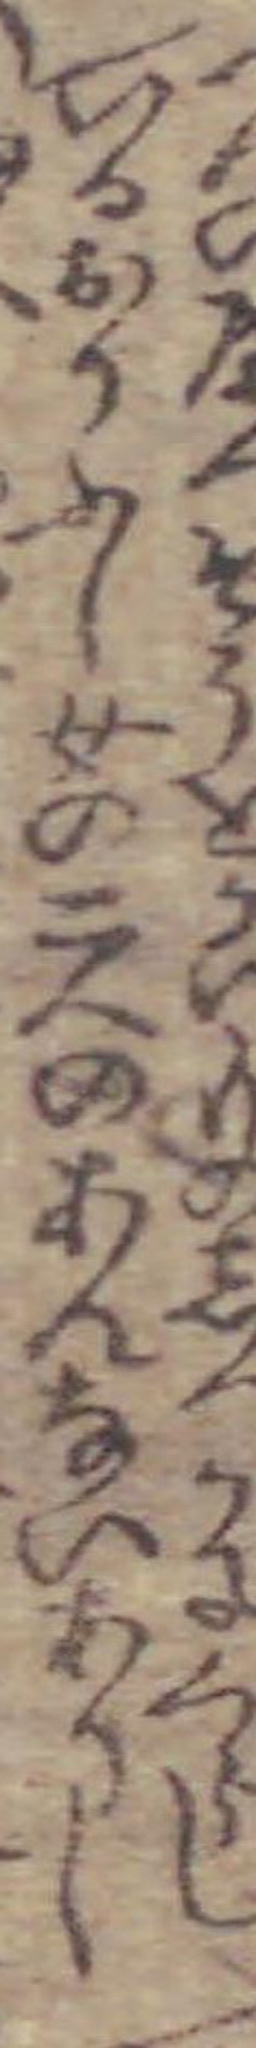いるおりふし女の二人のあんないありし
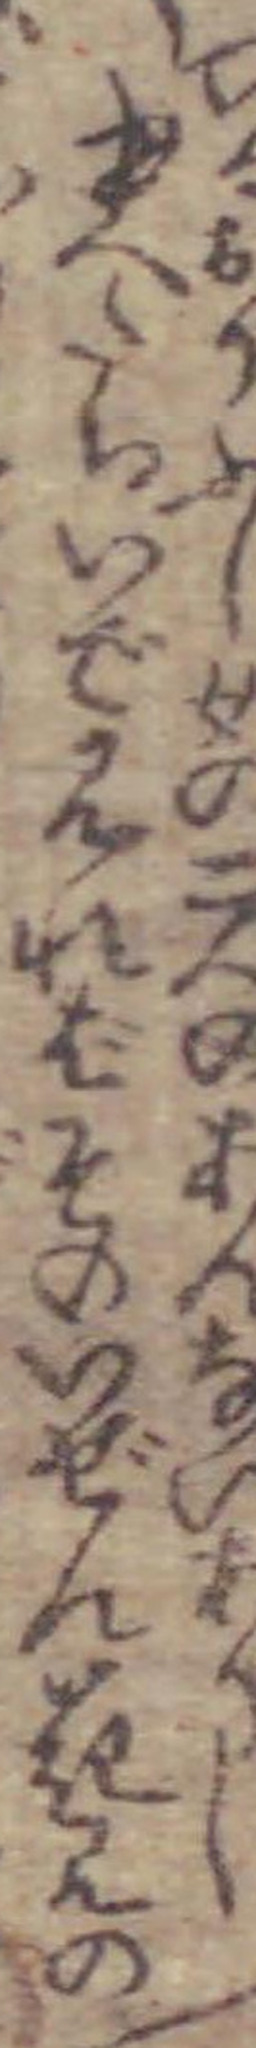ゆへたちいで見ればそのいぜん花見の
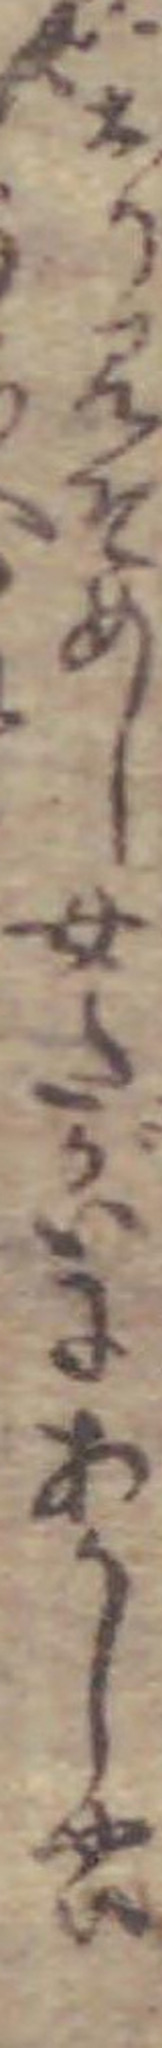おり見そめし女たがいにあかしやい
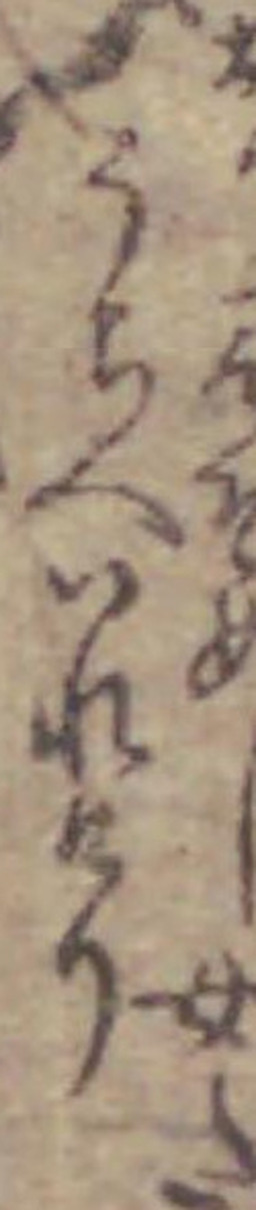うちへいれけり
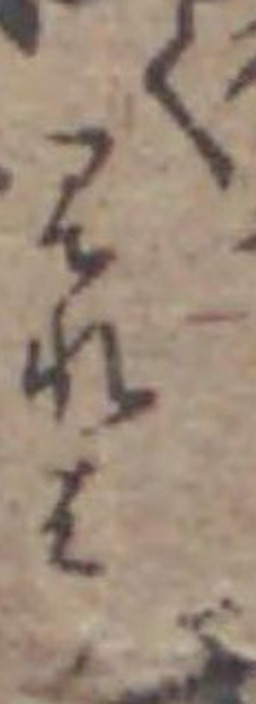見れは
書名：諸事米の飯 : 3巻
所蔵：国立国会図書館 National Diet Library, JAPAN
